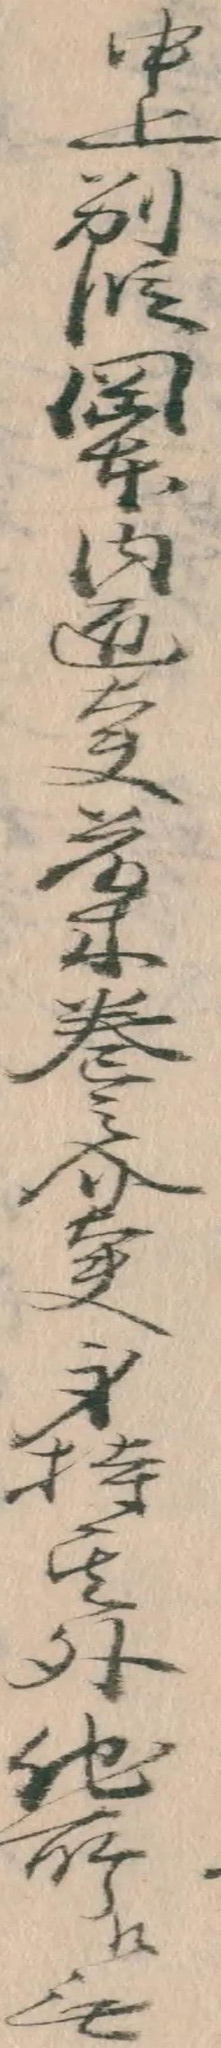申上別段岡本内匠大夫藤木巻之介大夫身持其外他所え無
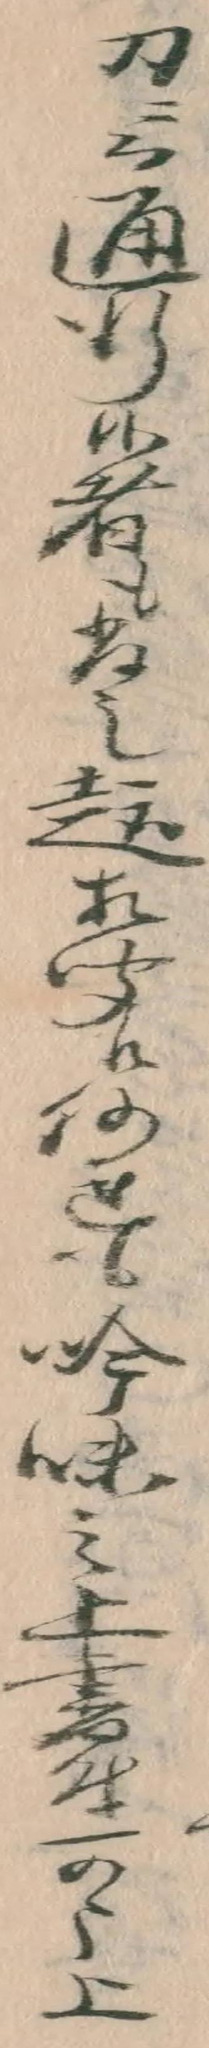刀ニ而通行候者も有之趣相聞え何れも吟味之上書付可申上
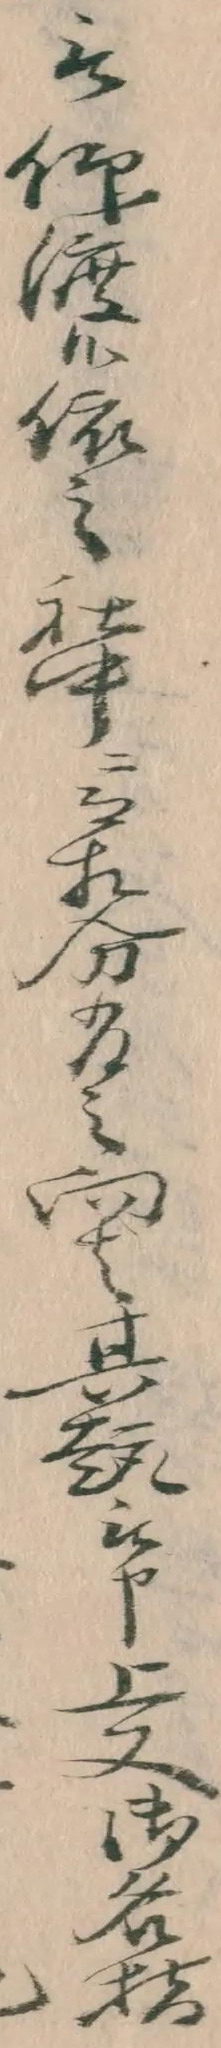被仰渡候依之社中ニ而相分有之向は其趣被申上又御名指
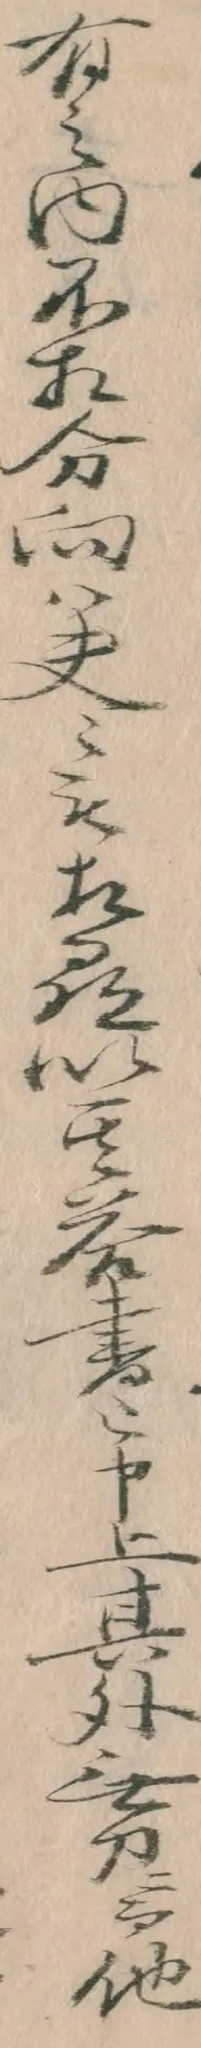有之内不相分向ハ夫々被相尋以其答書被申上其外無刀ニ而他
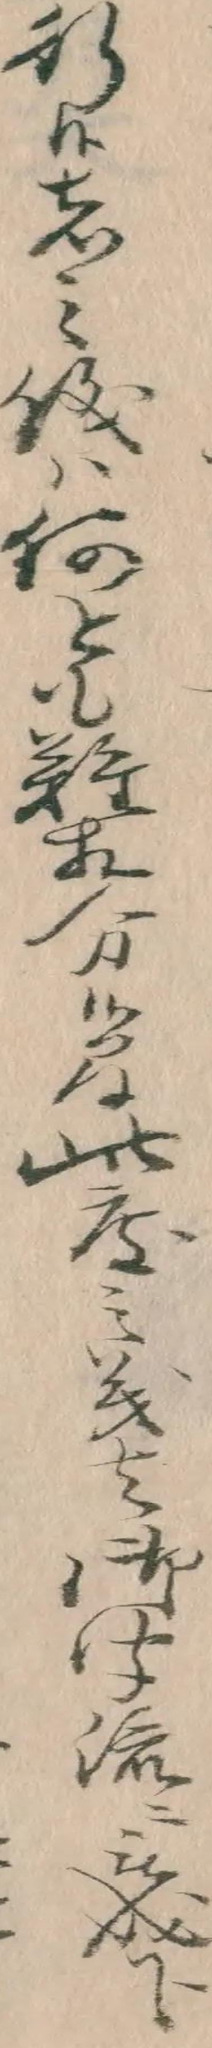行候者之儀ハ何とも難相分候間此度之義は御聞流ニ被成下
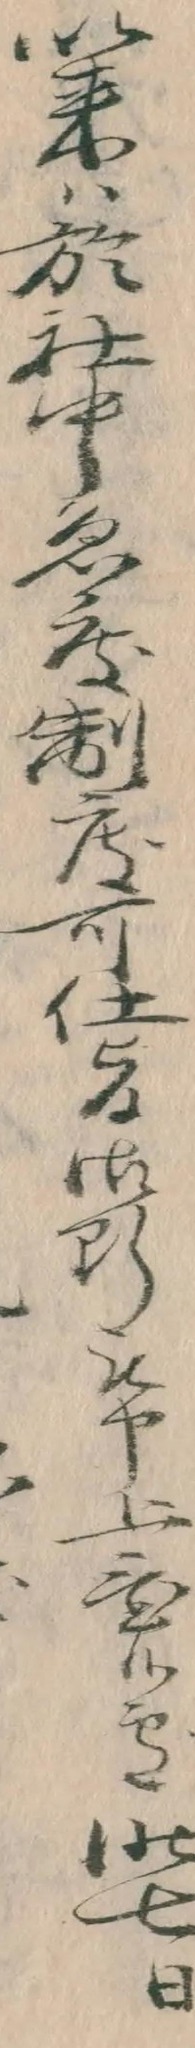以来ハ於社中急度制度可仕旨御断被申上置候處昨七日
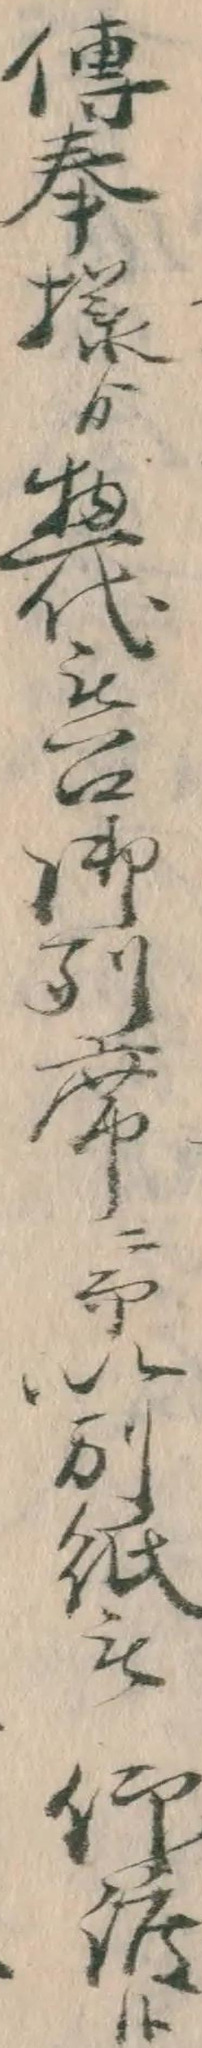傳奉様ゟ惣代被召御列席ニ而以別紙被仰渡候
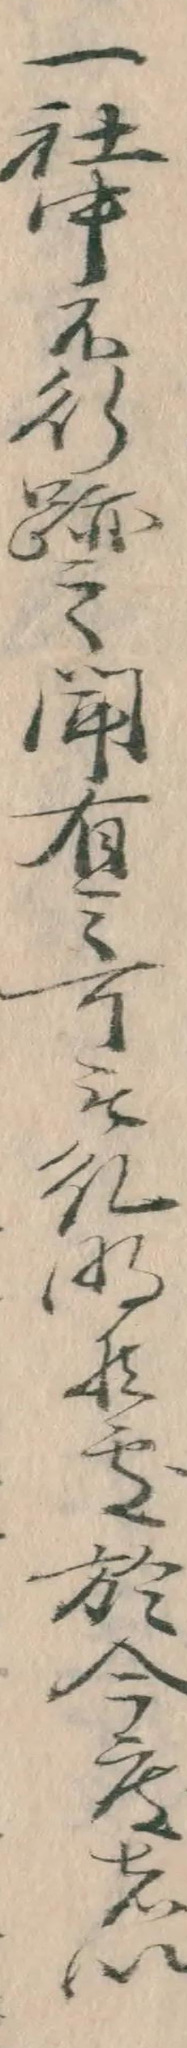一社中不行跡之聞有之可被糺明候處於今度者以
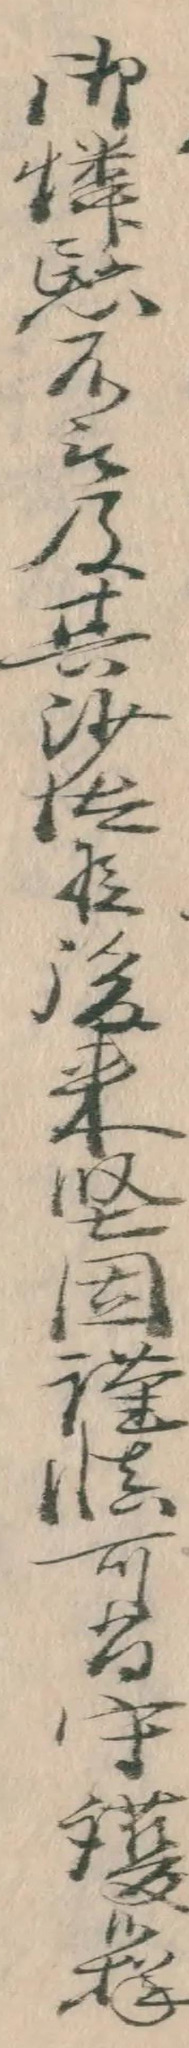御憐愍不被及其沙汰候後来堅固謹慎可有守護候様
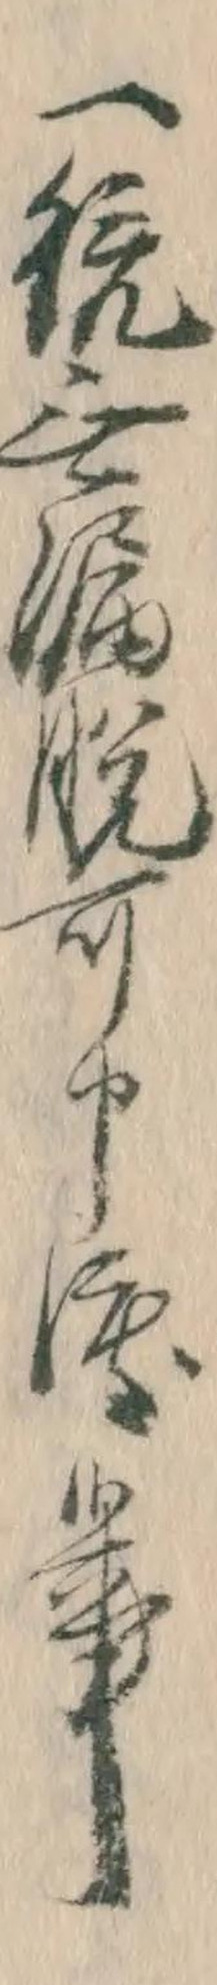一統無漏脱可申渡候事
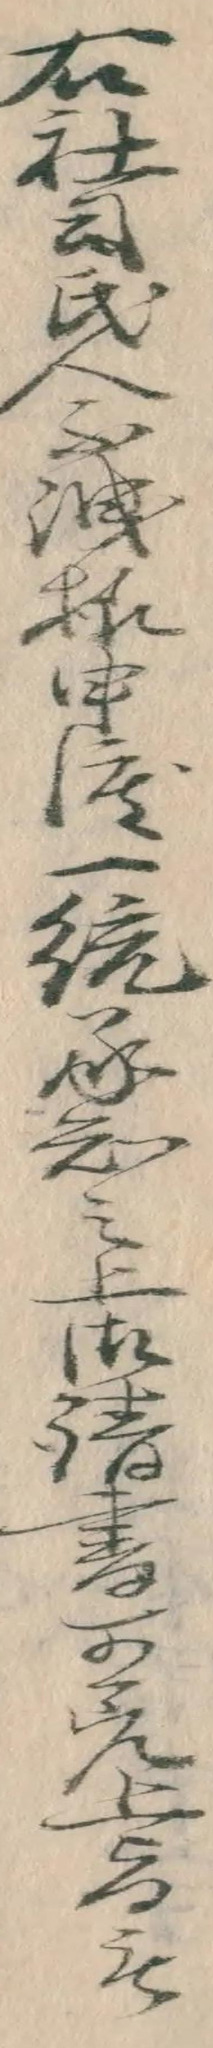右社司氏人不洩様申渡一統承知之上御請書可差上旨被
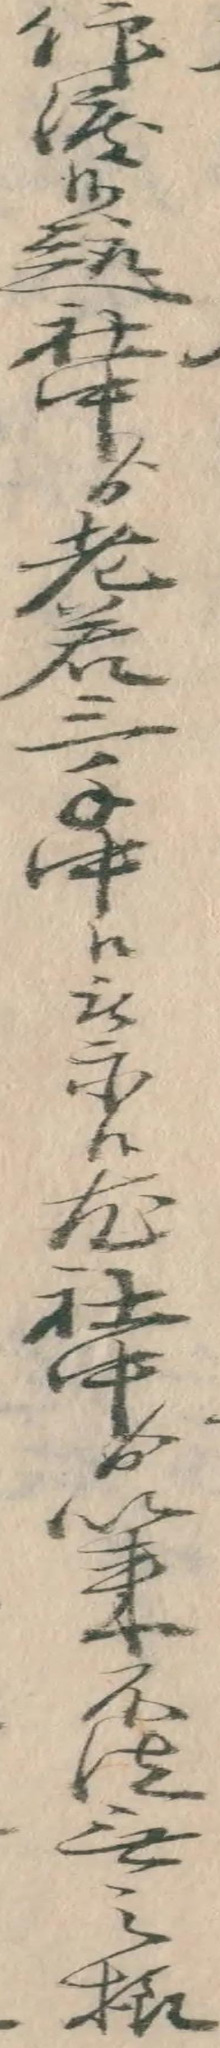仰渡候趣社中ゟ老若三手中え被示候尤社中ゟ以来不法無之様
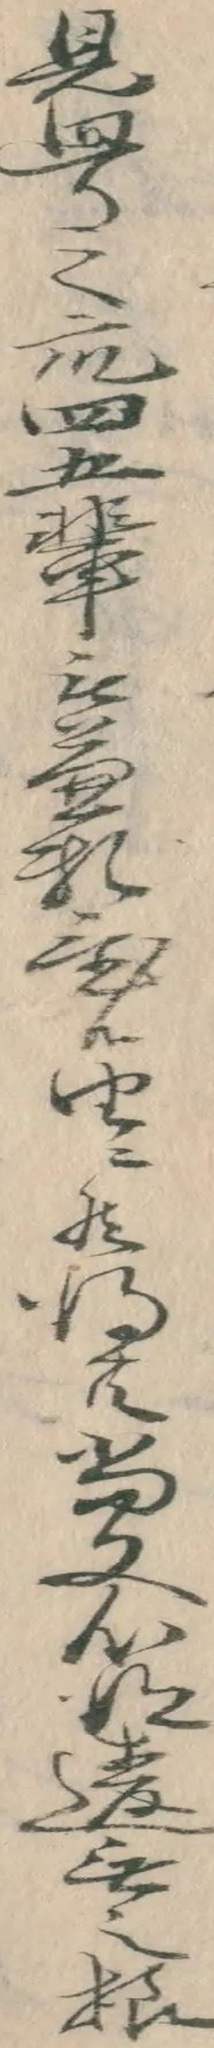見廻リ之衆四五輩被兼頼置候由ニ候得共尚又心得違無之様
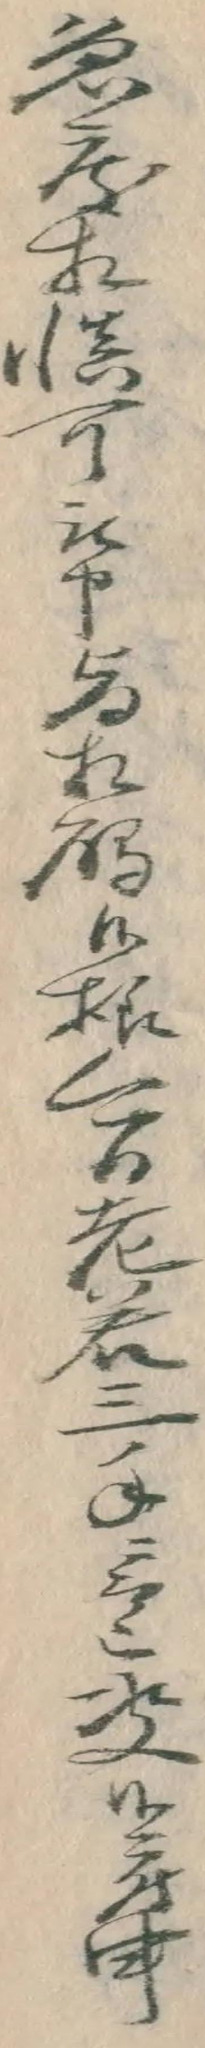急度相慎可被申旨相触候様今日老若三手に而被決候ニ付申

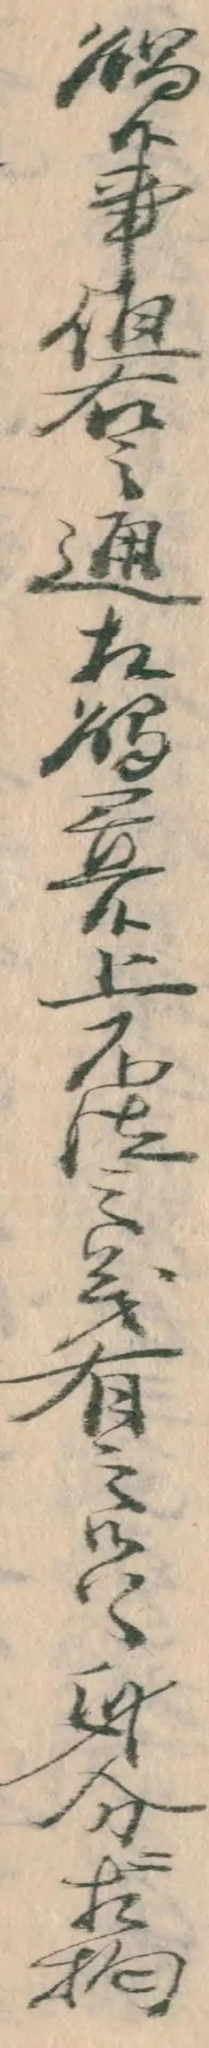触候事但右之通相触置候上不法之義有之候ハゝ身分ニ相拘
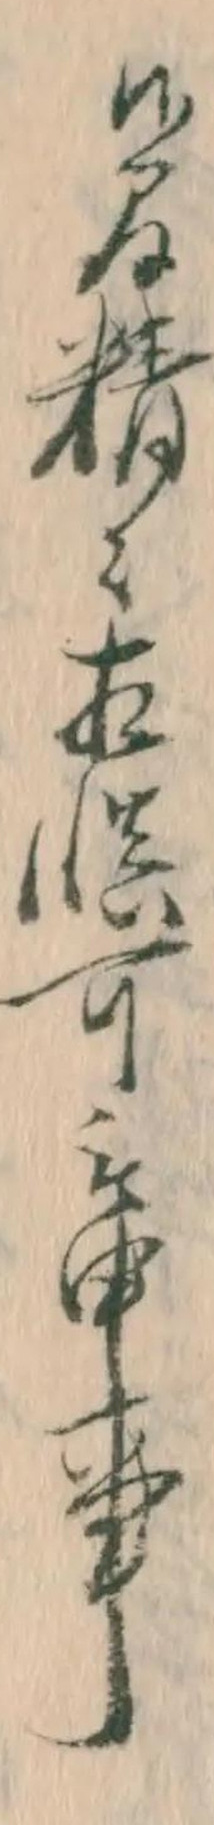候間精々相慎可被申事
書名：賀茂社記録. 第65冊
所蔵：国立国会図書館 National Diet Library, JAPAN
